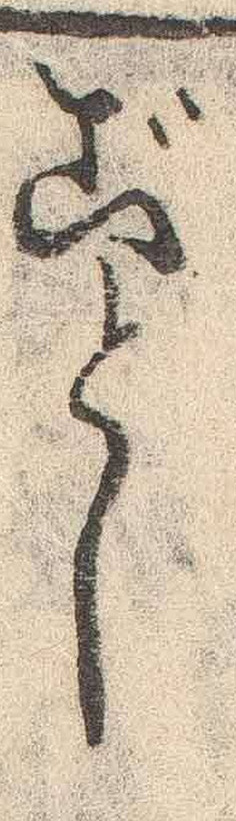ごとし
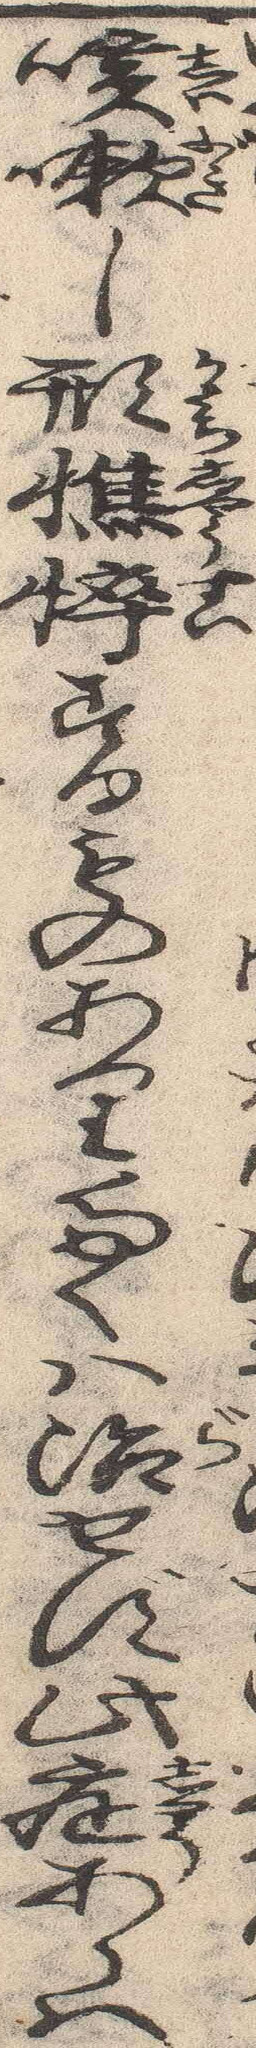喉嗽し形憔悴するものあり多くは治せず此症あらは
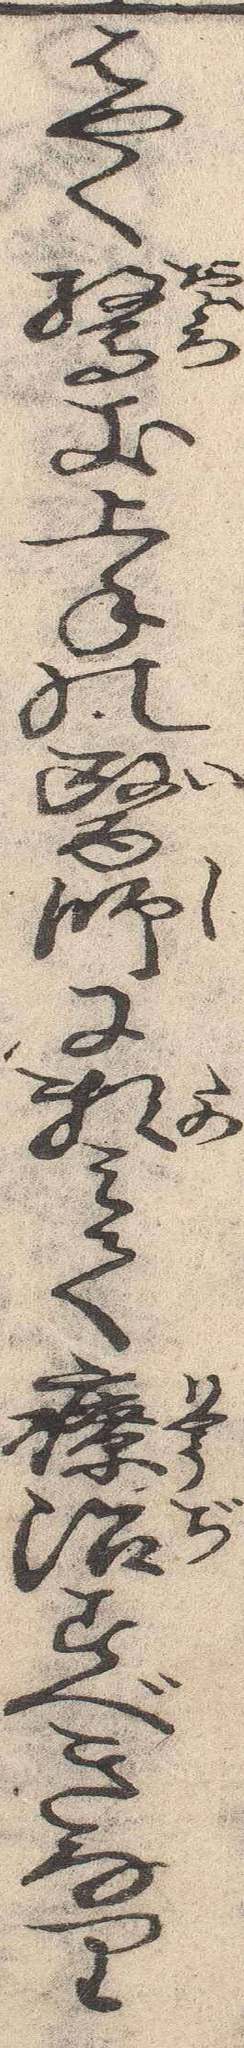はやく驚き上手の医師に頼みて療治すべきなり
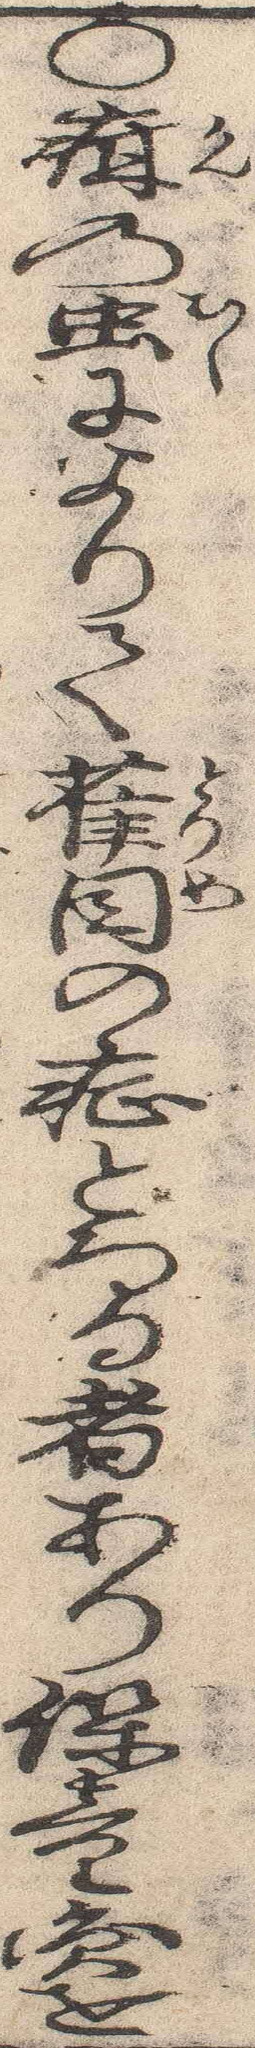○疳の虫によりて萑目の症となる者あり保童円を
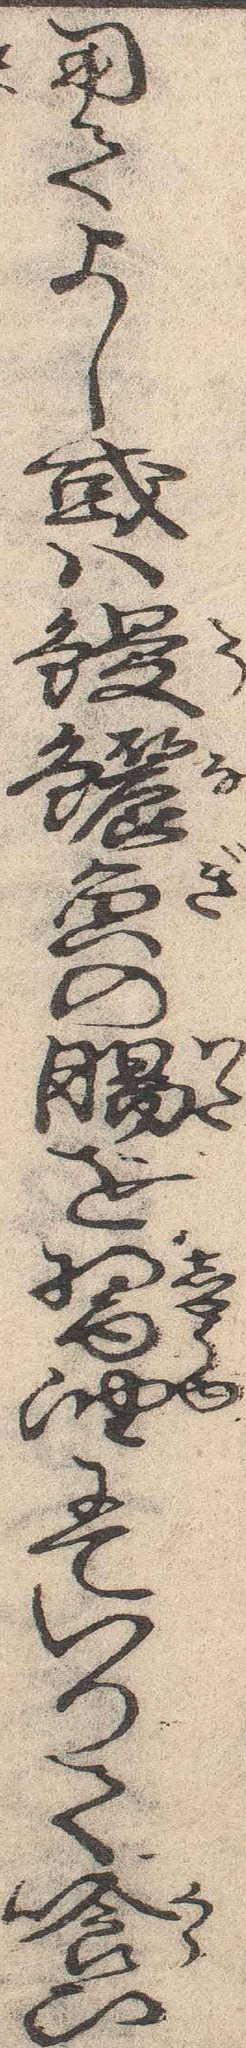用てよし或は鰻鱺魚の腸を醬油にていりて喰ひ
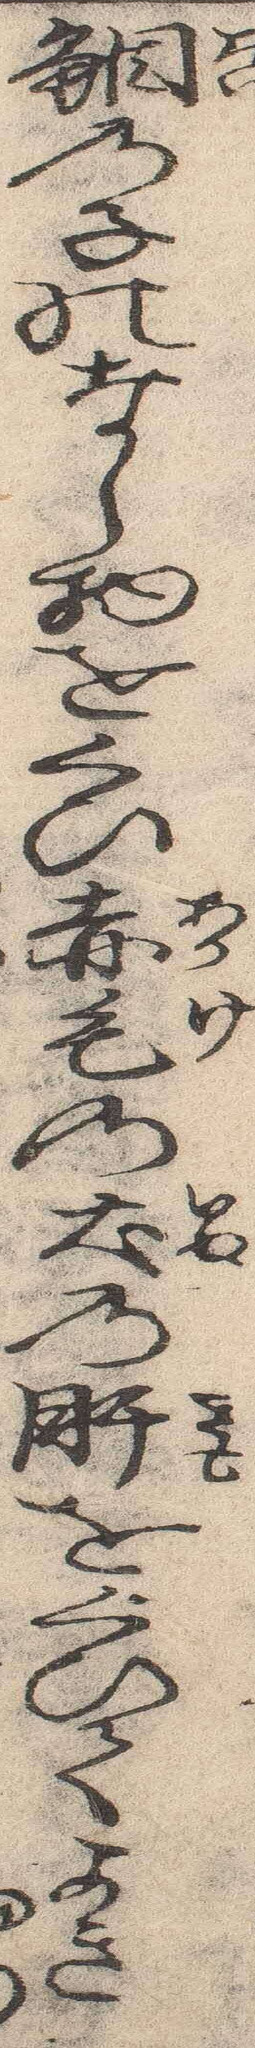鯛の子のなし物をくひ赤毛の犬の肝をくひてよきなり
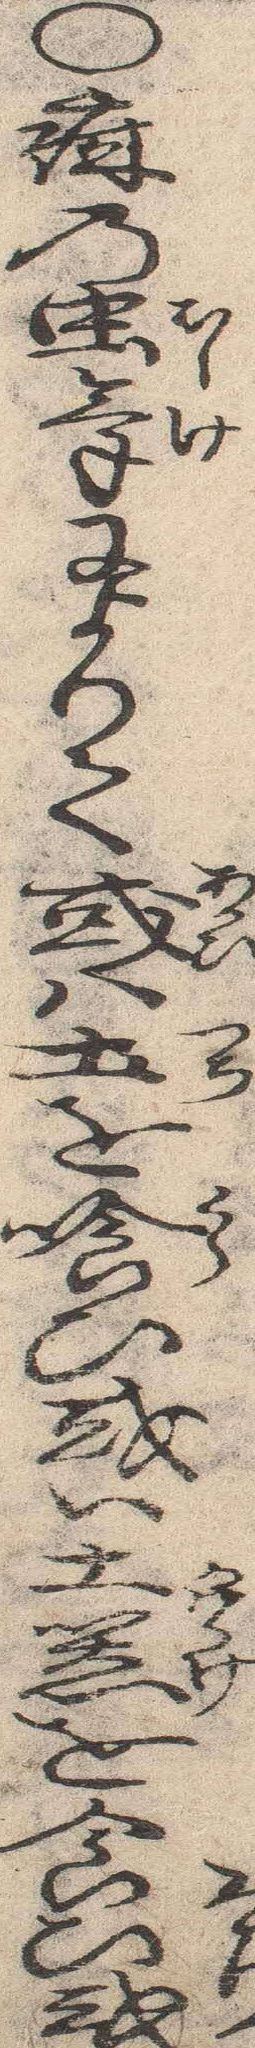○疳の虫気によりて或は土を喰ひ或は土器を食ひ或
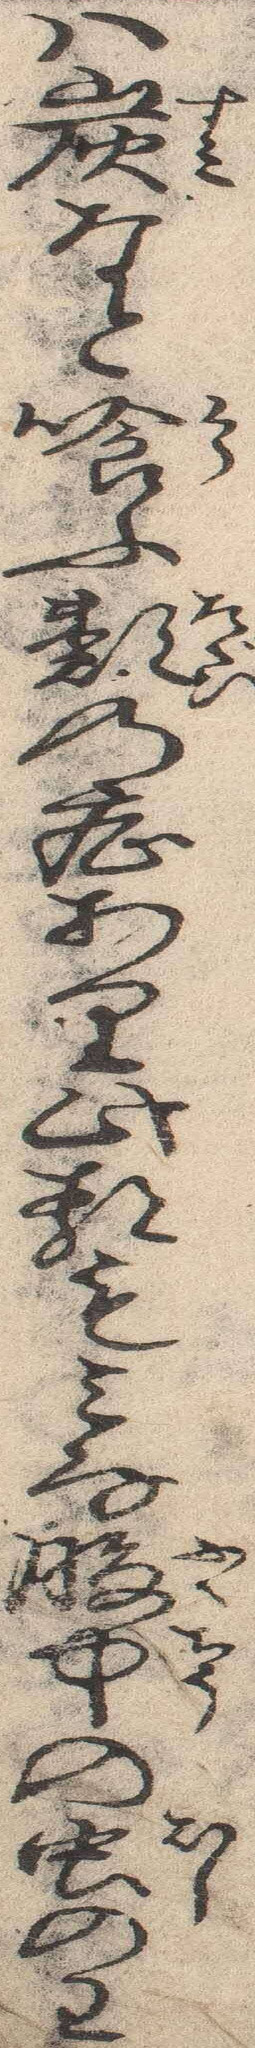は炭なと喰ふ類の症あり此類もみな腹中の虫のわ
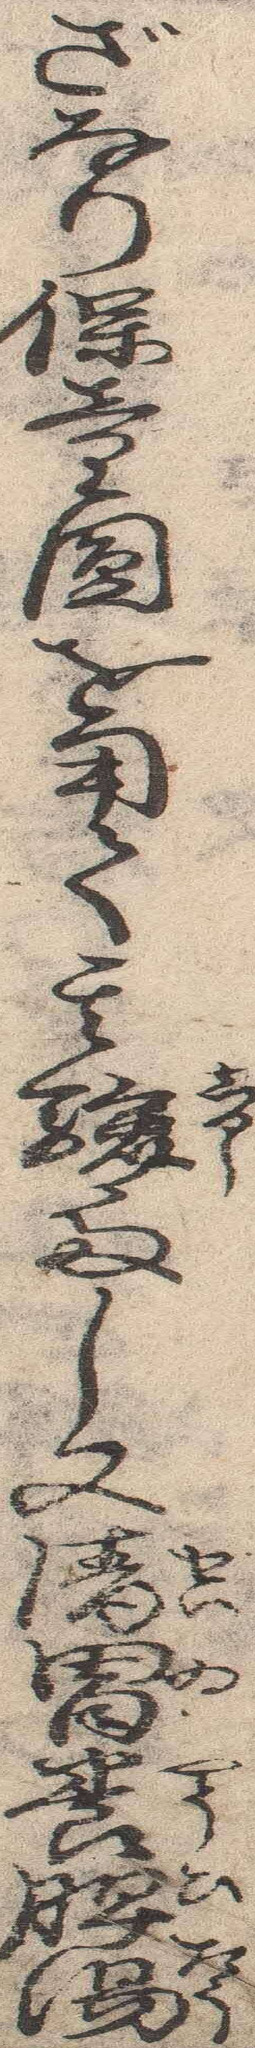ざなり保童円を用て其験多し又清胃養脾湯
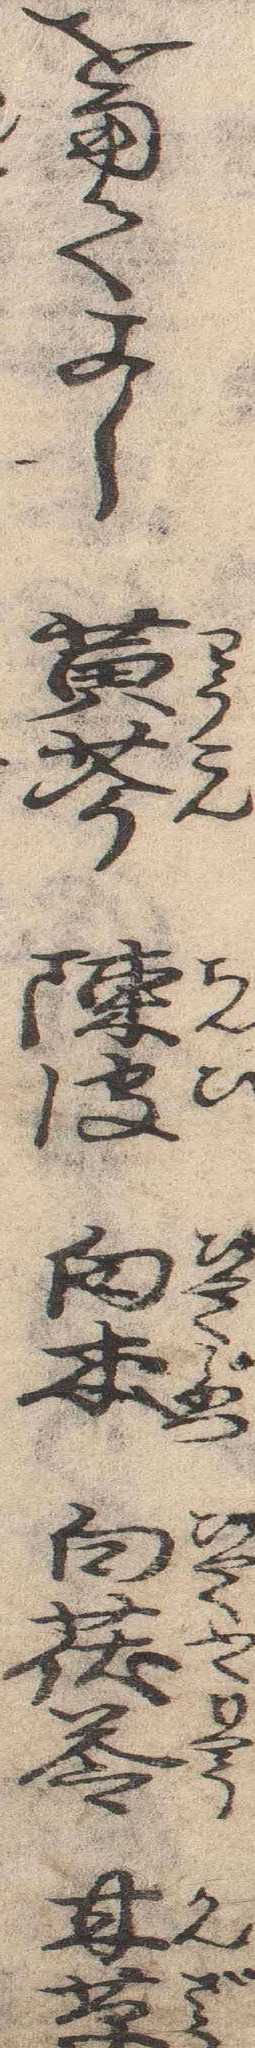を用てよし黄芩陳皮白朮白茯苓甘草

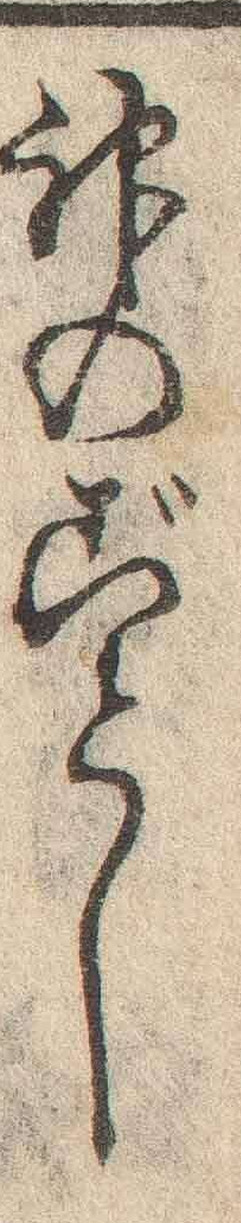神のごとし
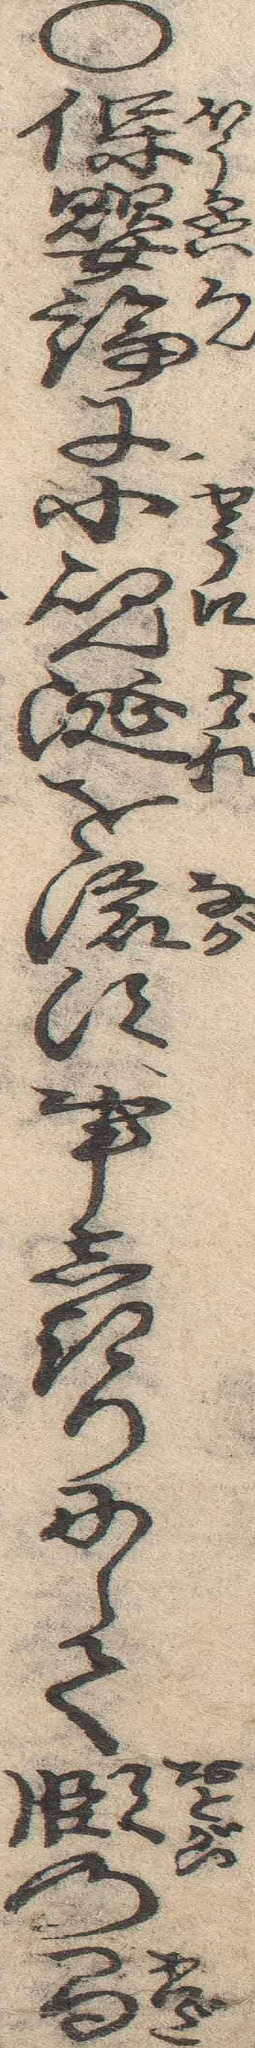○保嬰論に小児涎を流す事しきりにして頤の間
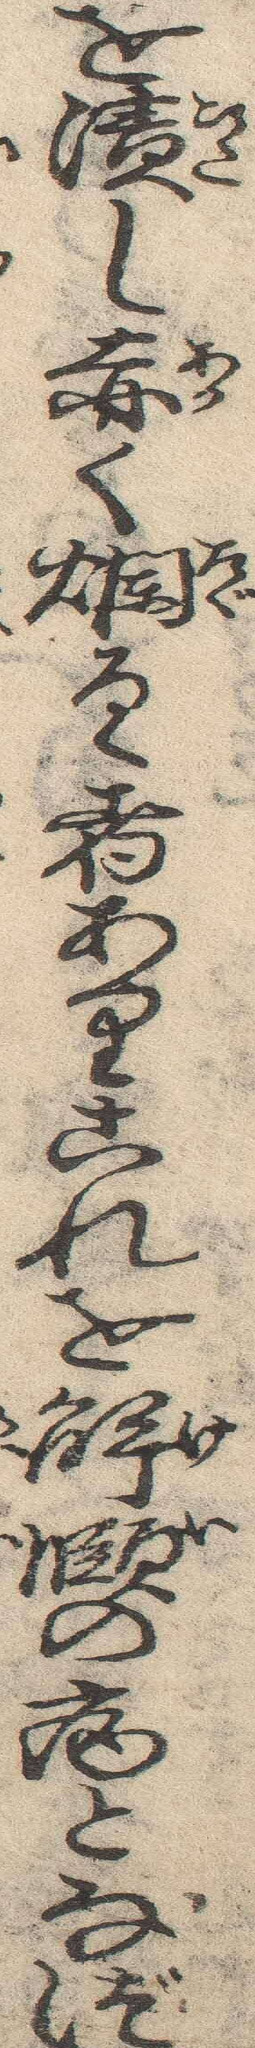を漬し赤く爛るゝ者ありこれを解頤の病となづ
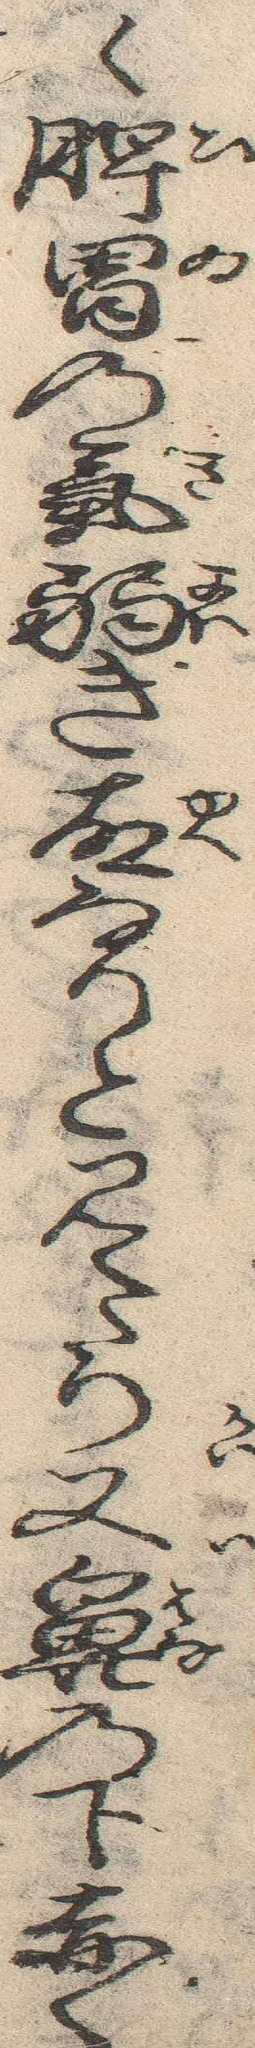く脾胃の気弱き故なりと見えたり又鼻の下赤く
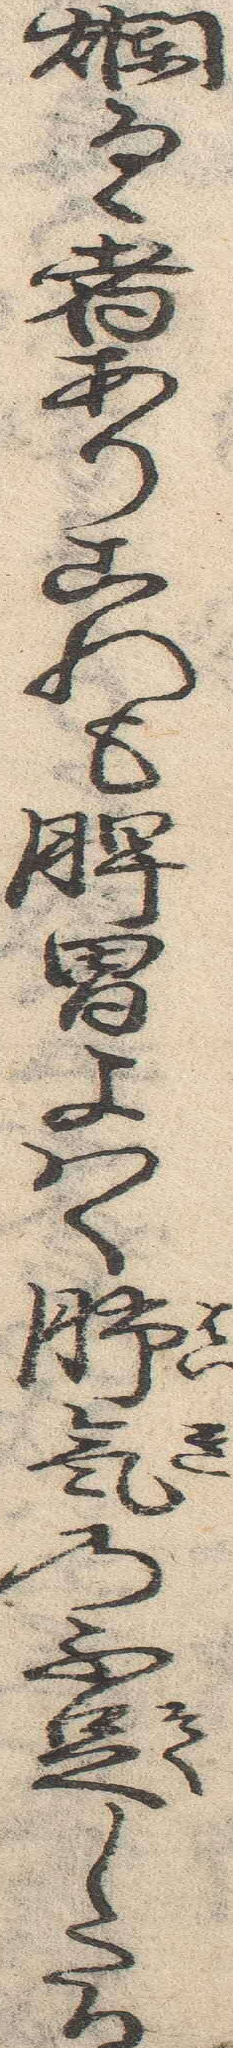爛るゝ者ありこれも脾胃よわく肺気の不足したる
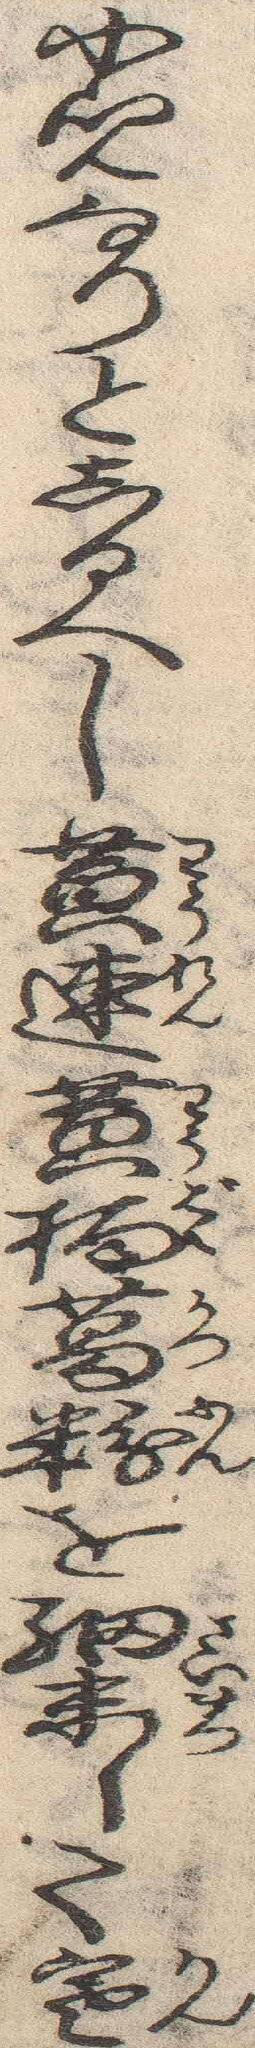小児なりとしるへし黄連黄柏葛粉を細末して寒
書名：小児必用養育草
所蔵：東京学芸大学附属図書館 国文学研究資料館
